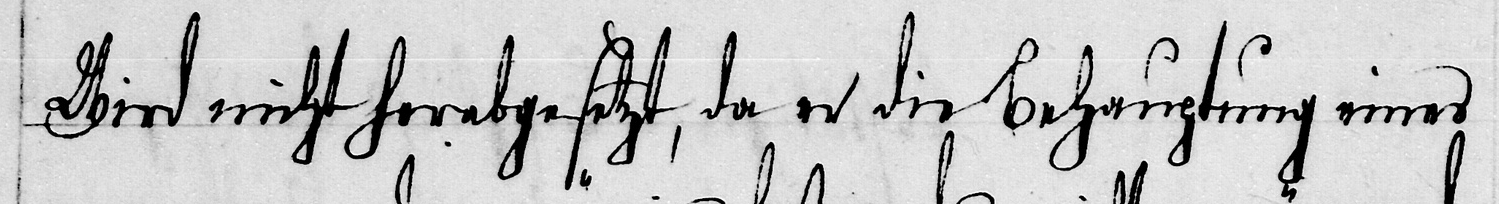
Wird nicht herabgesetzt, da er die Behauptung eines
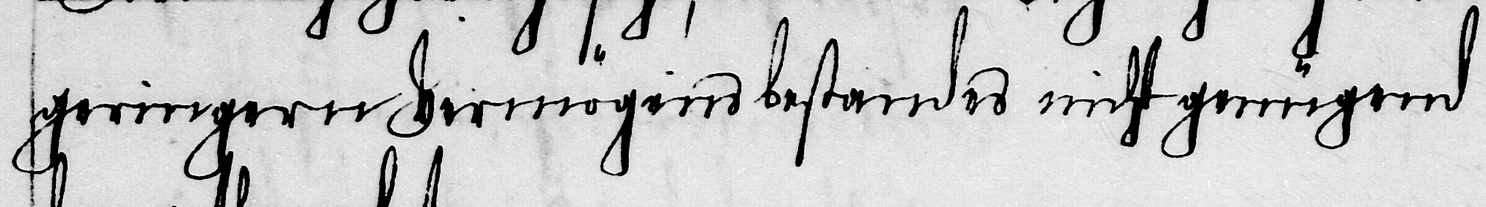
geringern Vermögensbestandes nicht genügend
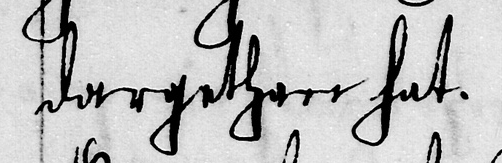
dargethan hat.
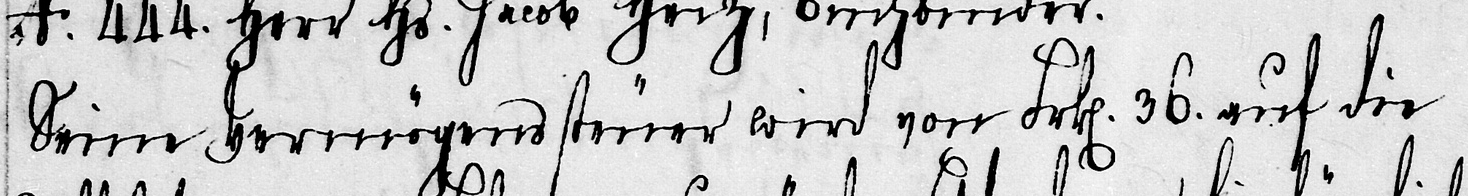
Seine Vermögenssteuer wird von Frk[en]. 36. auf die
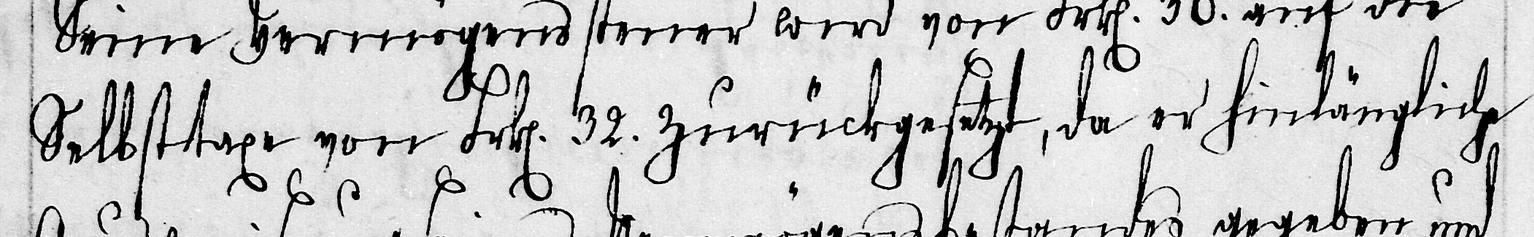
Selbsttaxe von Frk[en]. 32. zurückgesetzt, da er hinlängliche
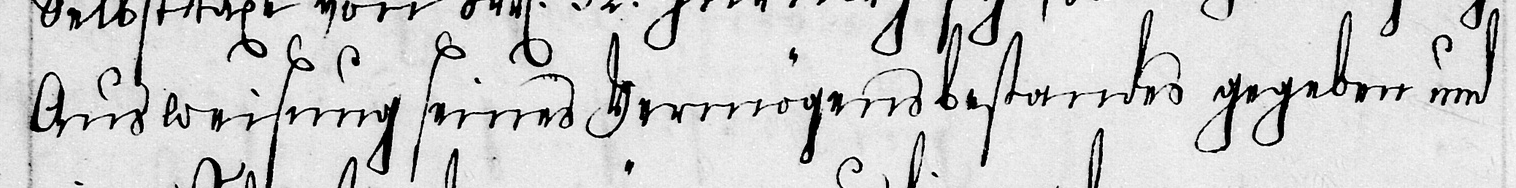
Ausweisung seines Vermögensbestandes gegeben und
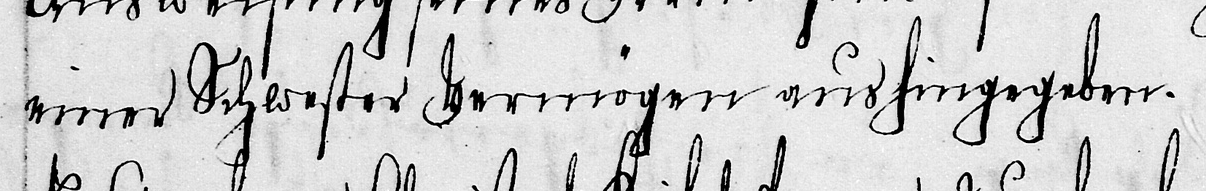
einer Schwester Vermögen aushingegeben.
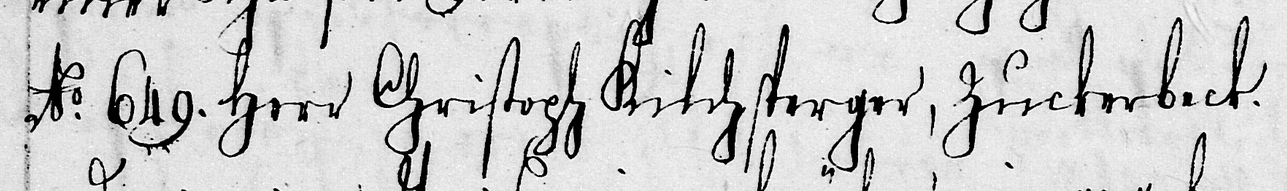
No. 649. Herr Christoph Kilchsperger, Zuckerbeck.
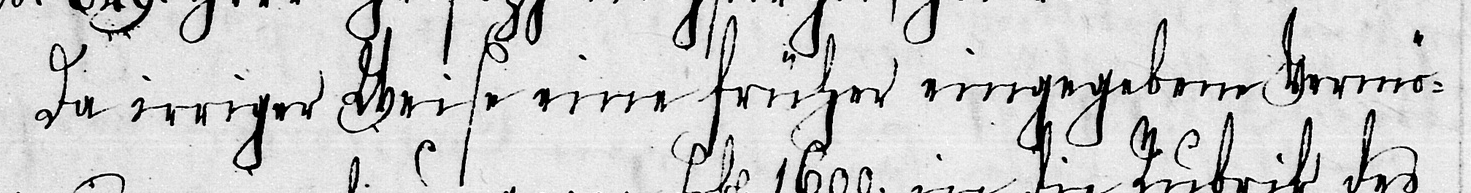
Da irriger Weise eine früher eingegebene Vermö¬
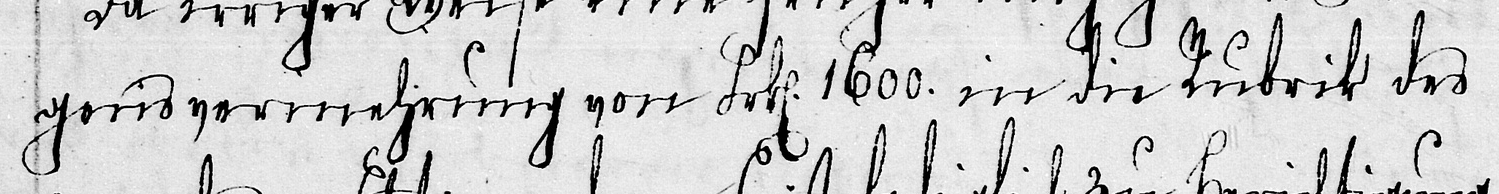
gensvermehrung von Frk[en]. 1600. in die Rubrik des
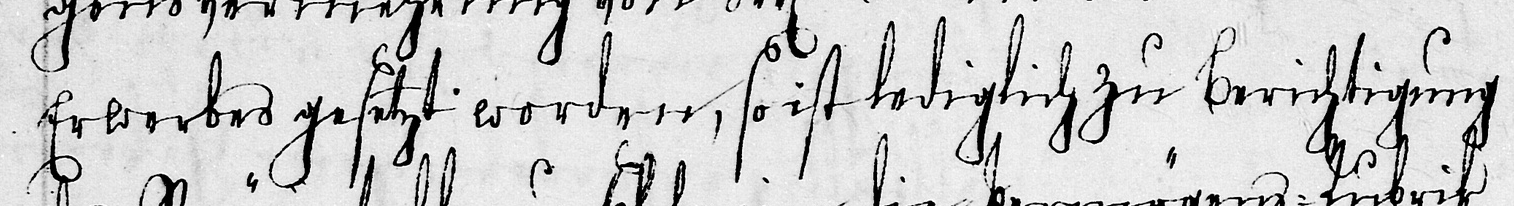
Erwerbs gesetzt worden, so ist lediglich zu Berichtigung
